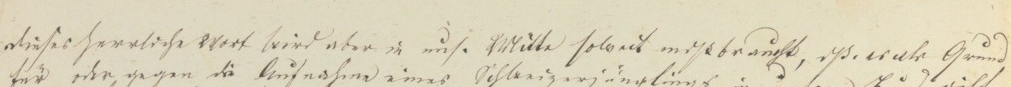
Dieses herrliche Wort wird aber in uns. Mitte so weit mißbraucht, dß. es als Grund
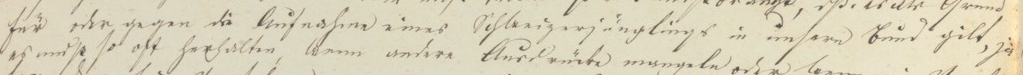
für oder gegen die Aufnahme eines Schweizerjünglings in unsern Bund gilt,
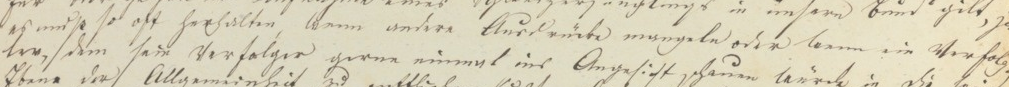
es muß so oft herhalten, wenn andere Ausdrücke mangeln oder wenn ein Verfolg-
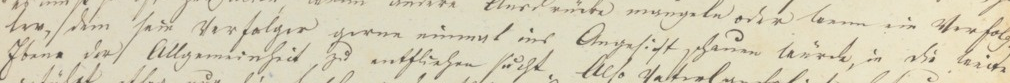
ter, dem sein Verfolger gerne einmal ins Angesicht schauen würde, in die weite
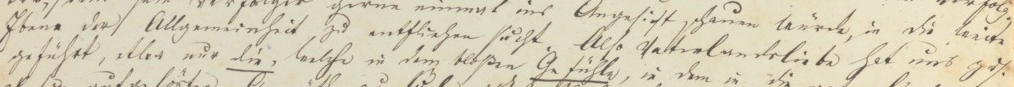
Ebene der Allgemeinheit zu entfliehen sucht. Also Vaterlandsliebe hat uns zus.
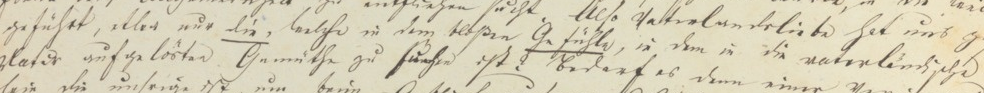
geführt, etwa nur die, welche in dem bloßen Gefühle, in dem in die vaterländische
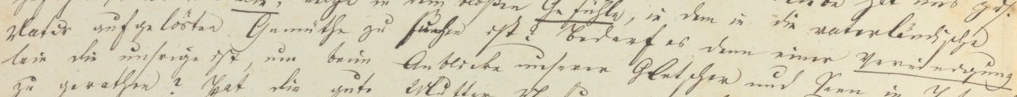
Natur aufgelösten Gemüthe zu suchen ist? Bedarf es denn einer Vereinigung
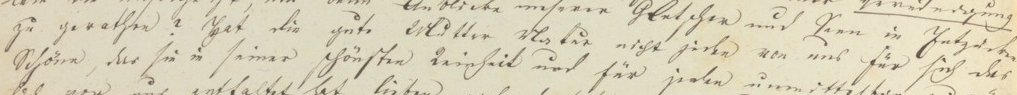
zu gerathen? Hat die gute Mutter Natur nicht jeden von uns für sich das
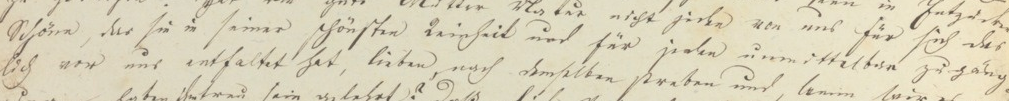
Schöne, das sie in seiner schönsten Reinheit und für jeden unmittelbar zugäng-
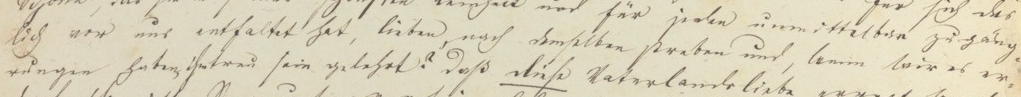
lich vor uns entfaltet hat, lieben, nach demselben streben und, wenn wir es er-
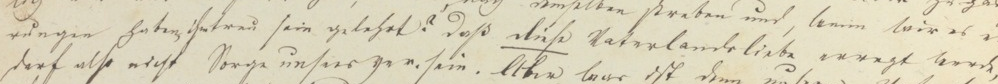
rungen haben, ihm treu sein gelehrt? Daß diese Vaterlandsliebe erregt werde,
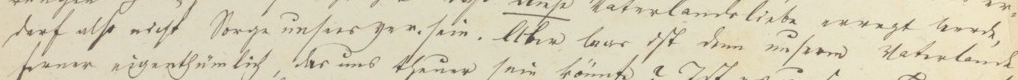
darf also nicht Sorge unsers Ver. sein. Aber was ist denn unserm Vaterlande
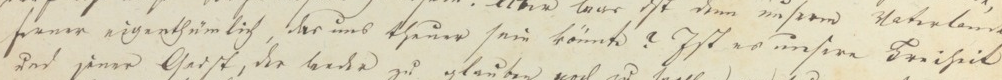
ferner eigenthümlich, das uns theuer sein könnte? Ist es unsere Freiheit
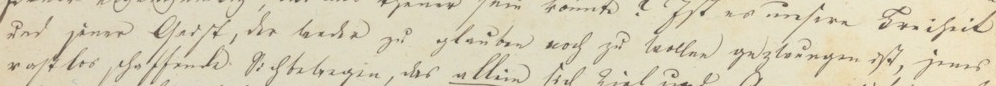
und jener Geist, der weder zu glauben noch zu wollen gezwungen ist, jenes
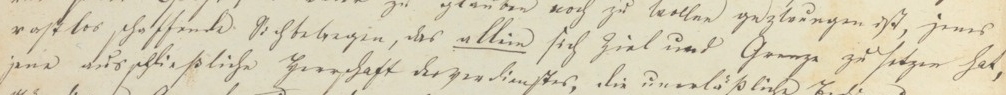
rastlos schaffende Sichbewegen, das allein sich Ziel und Grenze zu setzen hat,
